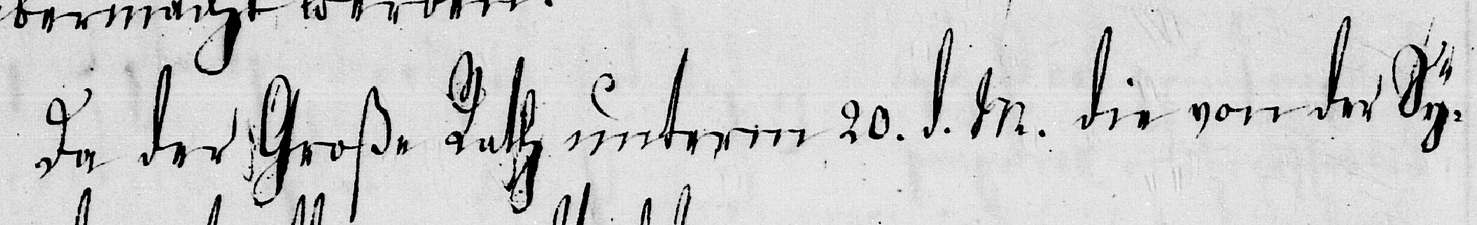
Da der Große Rathe unterm 20. d. M. die von der Sy¬
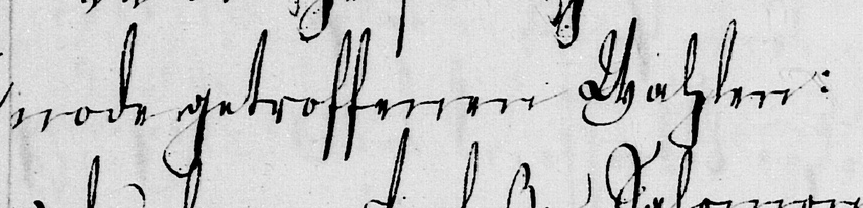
node getroffenen Wahlen:
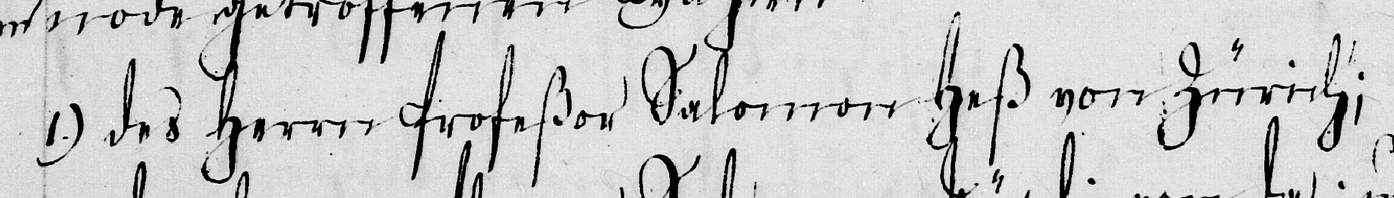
1.) des Herrn Profeßor Salomon Heß von Zürich;
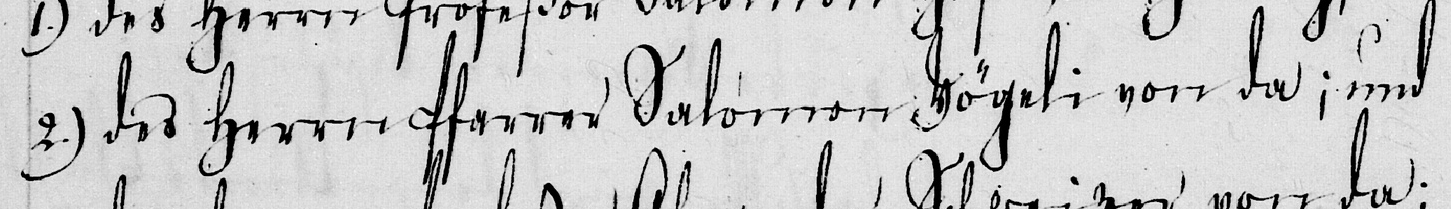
2.) des Herrn Pfarrer Salomon Vögeli von da; und
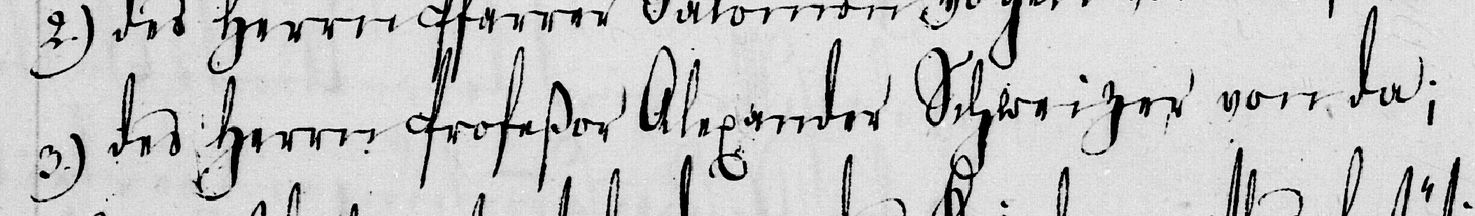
3.) des Herrn Profeßor Alexander Schweizer von da;
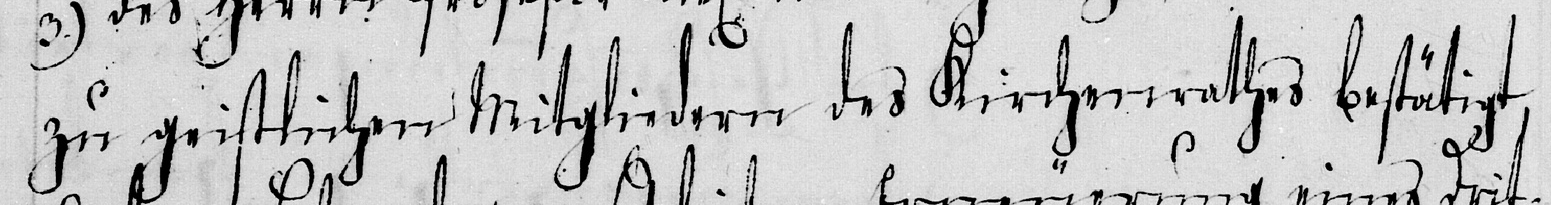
zu geistlichen Mitgliedern des Kirchenrathes bestätigt,
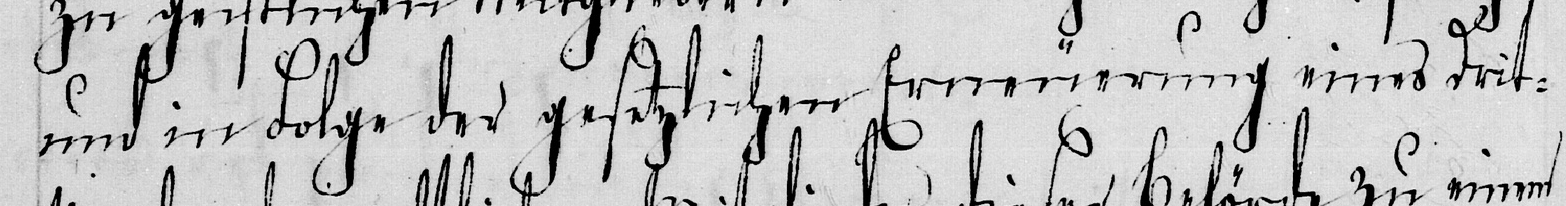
und in Folge der gesetzlichen Erneuerung eines Drit¬
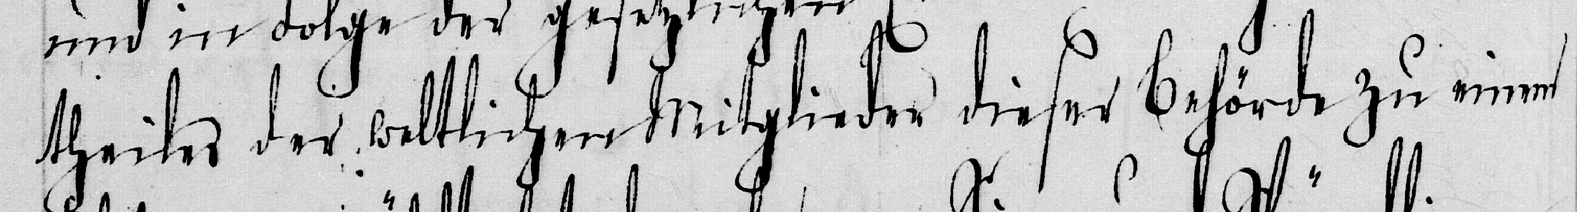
theiles der weltlichen Mitglieder dieser Behörde zu einem
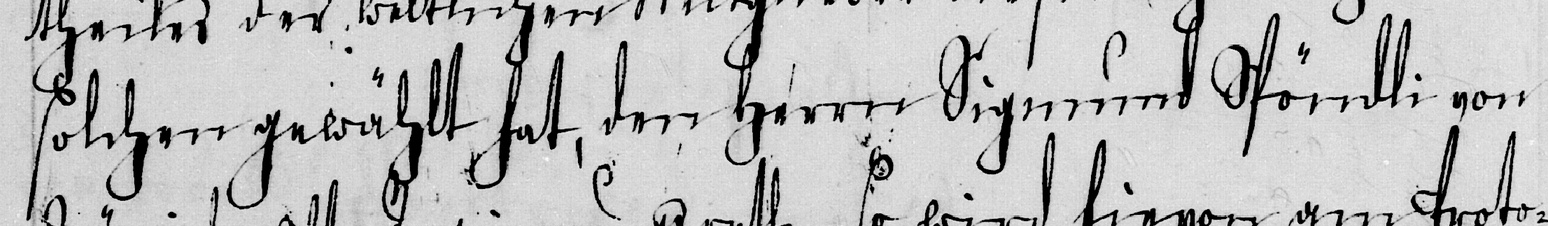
solchen gewählt hat, den Herrn Sigmund Spöndli von
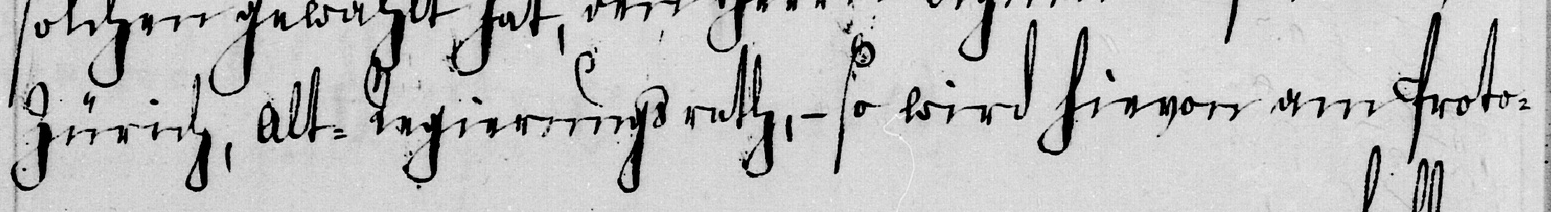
Zürich, Alt- Regierungsrath, – so wird hievon am Proto
